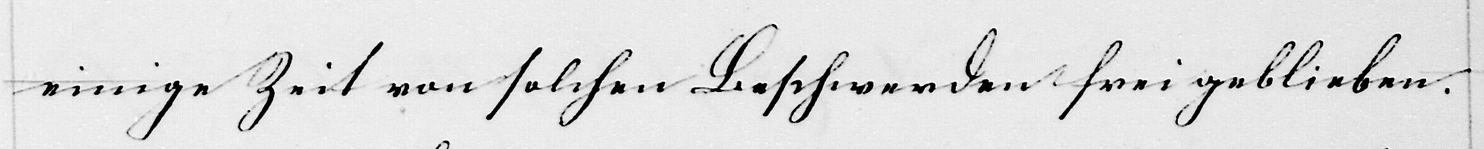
einige Zeit von solchen Beschwerden frei geblieben.
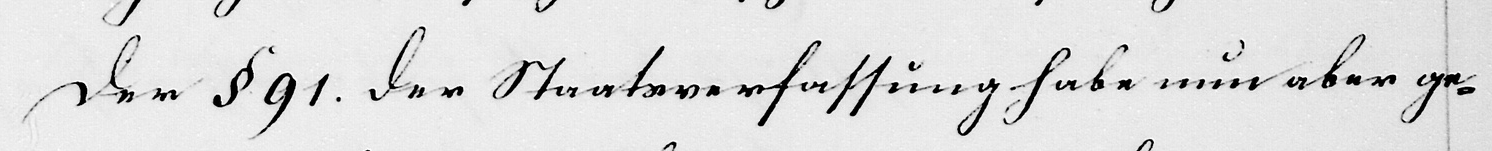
Der § 91. der Staatsverfassung habe nun aber ge¬
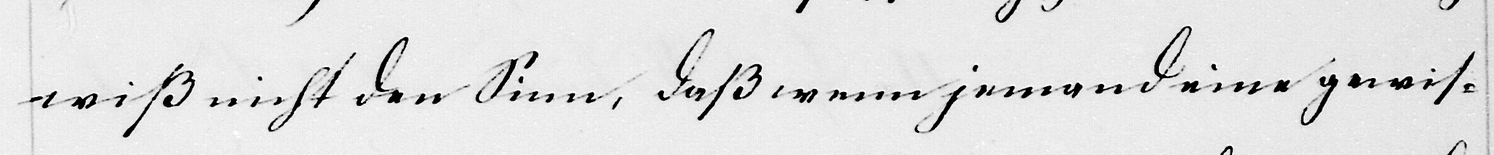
wiß nicht den Sinn, daß wenn jemand eine gewis¬
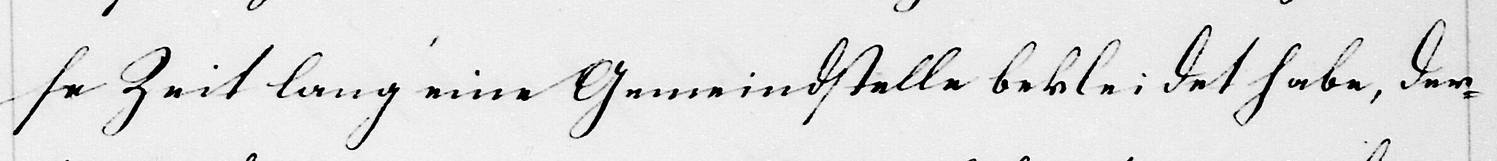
se Zeit lang eine Gemeindstelle bekleidet habe, der¬
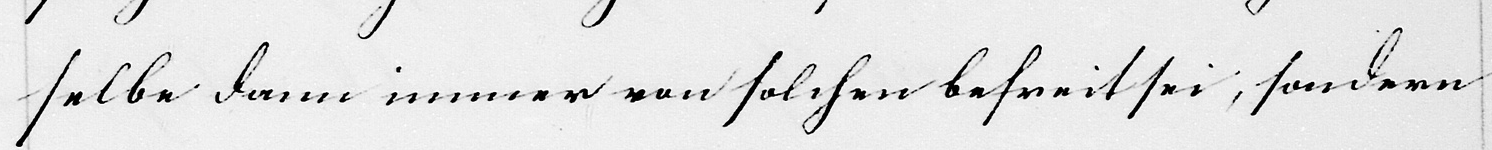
selbe dann immer von solchen befreit sei, sondern
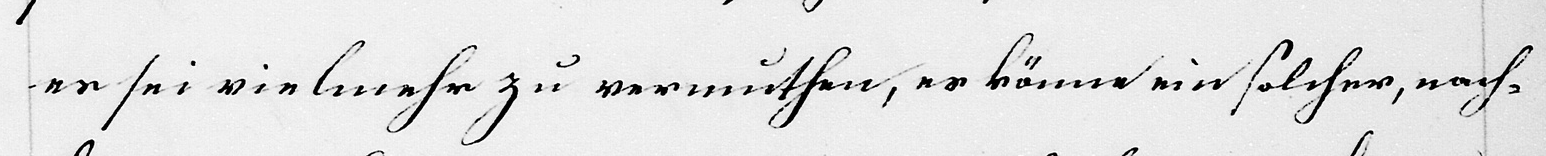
es sei vielmehr zu vermuthen, es könne ein solcher, nach¬
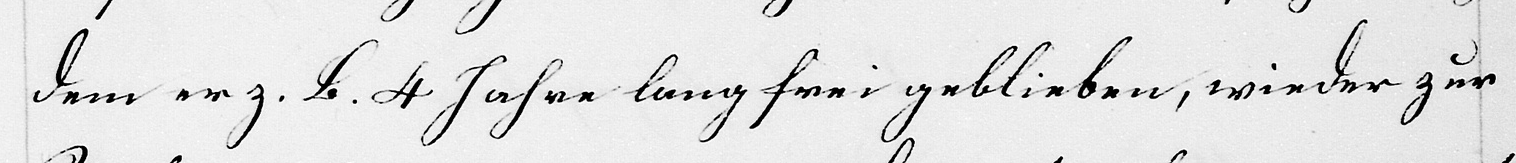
dem er z. B. 4 Jahre lang frei geblieben, wieder zur
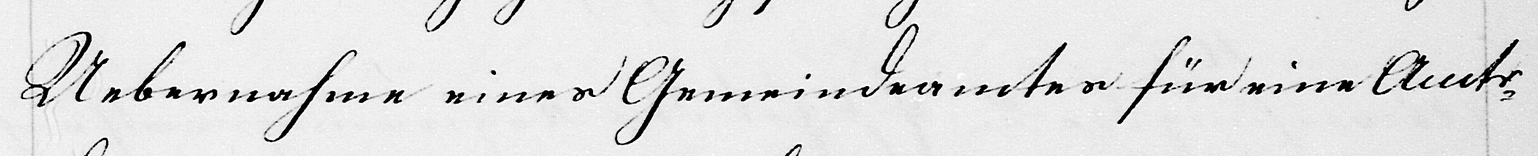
Uebernahme eines Gemeindeamtes für eine Amts¬
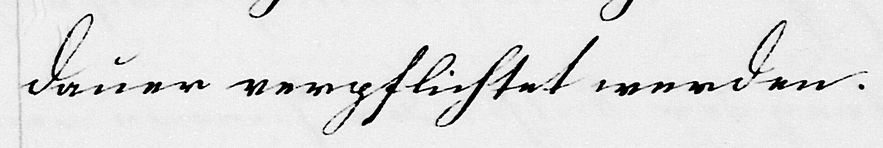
dauer verpflichtet werden.
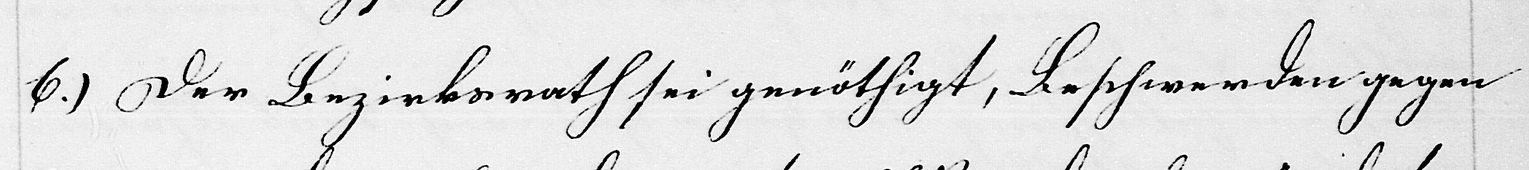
b.) Der Bezirksrath sei genöthigt, Beschwerden gegen
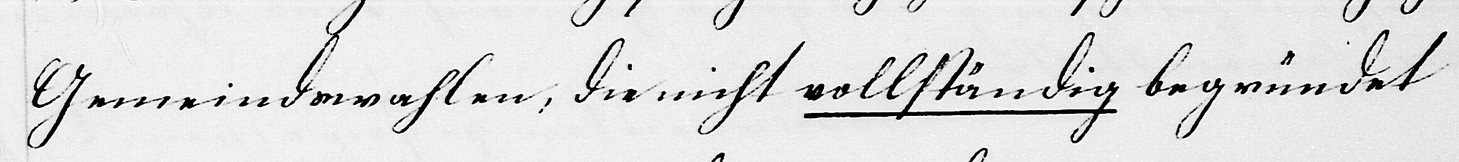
Gemeindswahlen, die nicht vollständig begründet
